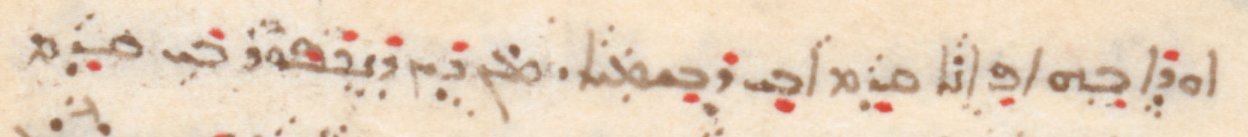ܐܘܕܐ ܒܗ ܐܦ ܐܢܐ ܩܕܡ ܐܒܝ ܕܒܫܡܝܐ. ܡ̇ܢ ܕܝܢ ܕܢܟܦܘܪ ܒܝ ܩܕܡ
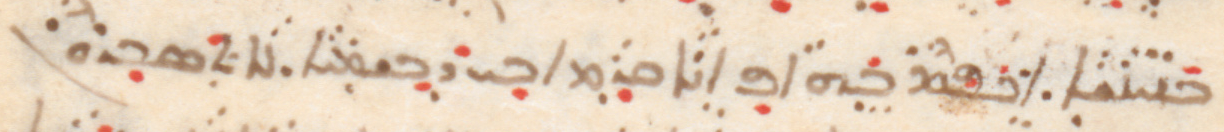ܒܢ̈ܝܢܫܐ. ܐܟܦܘܪ ܒܗ ܐܦ ܐܢܐ ܩܕܡ ܐܒܝ ܕܒܫܡܝܐ. ܠܐ ܬܣܒܪܘܢ
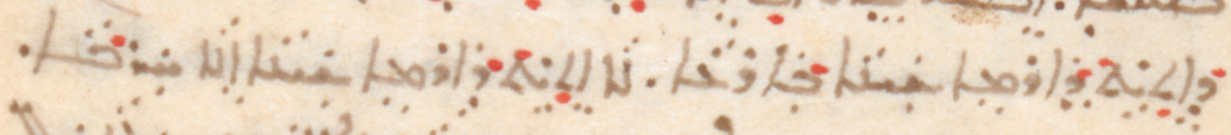ܕܐܬܝܬ ܕܐܪܡܐ ܫܝܢܐ ܒܐܪܥܐ. ܠܐ ܐܬܝܬ ܕܐܪܡܐ ܫܝܢܐ ܐܠܐ ܚܪ̈ܒܐ.
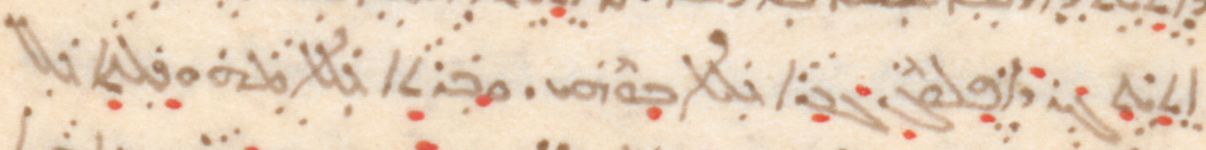ܐܬܝܬ ܓܝܪ ܕܐܦܠܘܓ ܓܒܪܐ ܥܠ ܐܒܘܗܝ. ܘܒܪܬܐ ܥܠ ܐܡܗ̇ ܘܟܠܬܐ ܥܠ
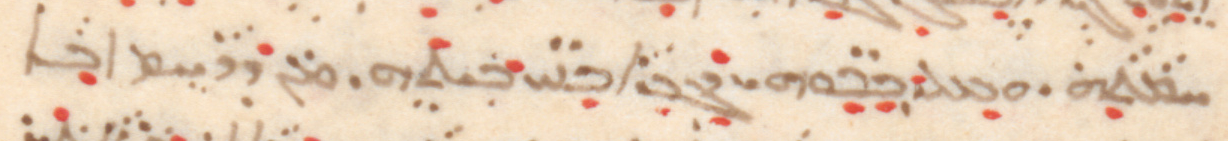ܚܡܬܗ̇. ܘܒܥܠܕܒܒ̈ܘܗܝ ܕܓܒܪܐ ܒܢ̈ܝ ܒܝܬܗ. ܡ̇ܢ ܕܪܚܡ ܐܒܐ
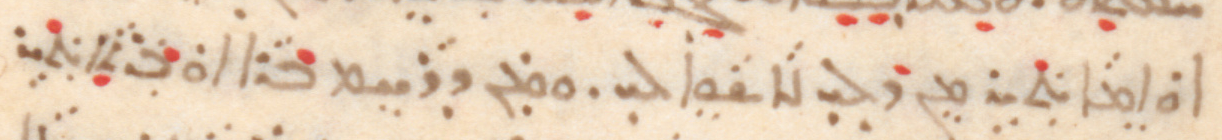ܐܘ ܐܡܐ ܝܬܝܪ ܡ̣ܢ ܕܠܝ ܠܐ ܫ̇ܘܐ ܠܝ̣. ܘܡ̇ܢ ܕܪܚܡ ܒܪܐ ܐܘ ܒܪܬܐ ܝܬܝܪ
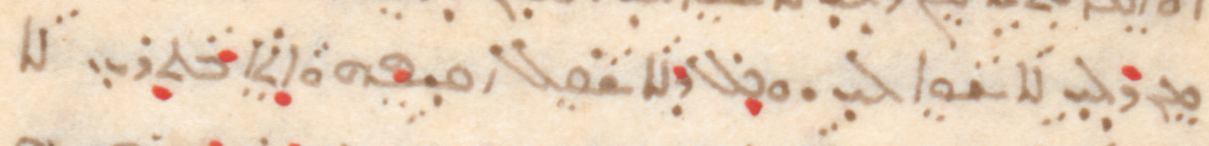ܡ̣ܢ ܕܠܝ ܠܐ ܫܘܐ ܠܝ. ܘܟܠ ܕܠܐ ܫ̇ܩܠ ܙܩܝܦܗ ܘܐܬ̇ܐ ܒܬܪܝ܆ ܠܐ
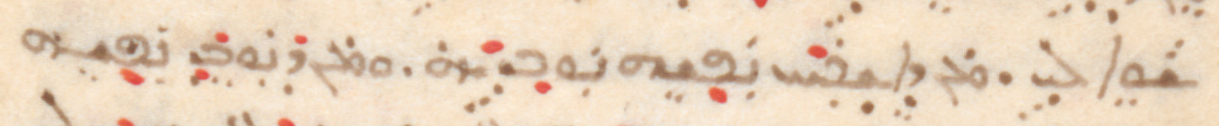ܫ̇ܘܐ ܠܝ. ܡ̇ܢ ܕܐܫܟܚ ܢܦܫܗ ܢܘܒܕܝܗ. ܘܡ̇ܢ ܕܢܘܒܕ ܢܦܫܗ
